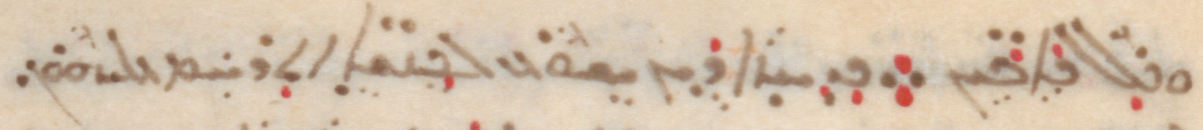ܘܟܠ ܟܐܒ̈ܝܢ܀ ܟܕ ܚܙ̣ܐ ܕܝܢ ܝܫܘܥ ܠܟܢܫ̈ܐ ܐܬܪܚܡ ܥܠܝܗܘܢ.
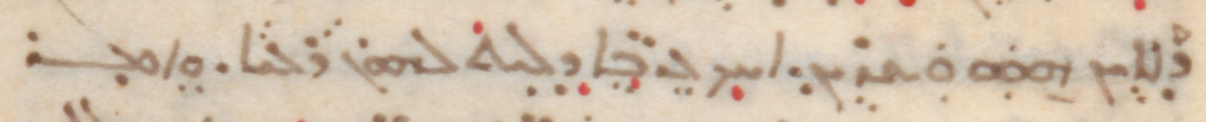ܕܠܐܝܢ ܗܘܘ ܘܫܪܝܢ: ܐܝܟ ܥܪ̈ܒܐ ܕܠܝ̣ܬ ܠܗܘܢ ܪܥܝܐ. ܘܐܡ̣ܪ
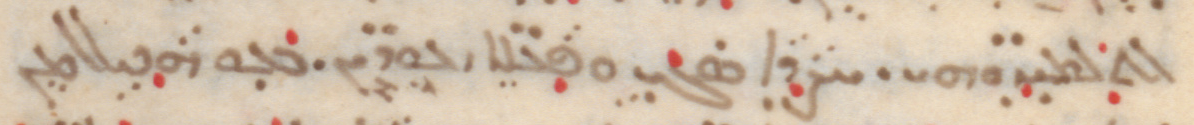ܠܬܠܡܝܕܘ̈ܗܝ. ܚܨܕܐ ܣܓܝ ܘܦܥ̈ܠܐ ܙܥܘܪ̈ܝܢ. ܒܥ̣ܘ ܗܟܝܠ ܡ̣ܢ
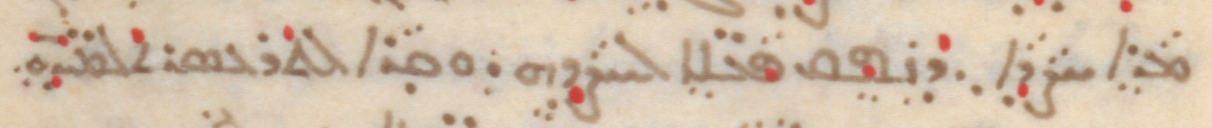ܡܪܐ ܚܨܕܐ܆ ܕܢ̇ܦܩ ܦܥ̈ܠܐ ܠܚܨܕܗ. ܘܩ̣ܪܐ ܠܬܪܥܣܪ ܬ܏ܠܡ̈ܝܕܘ܆
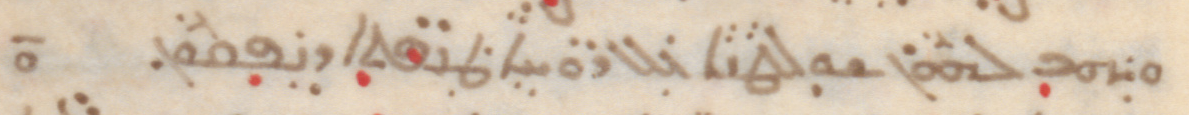ܘܝܗ̣ܒ ܠܗܘܢ ܫܘܠܛܢܐ ܥܠ ܪ̈ܘܚܐ ܛܢܦ̈ܬܐ ܕܢ̇ܦܩܘܢ. ܏ܘ
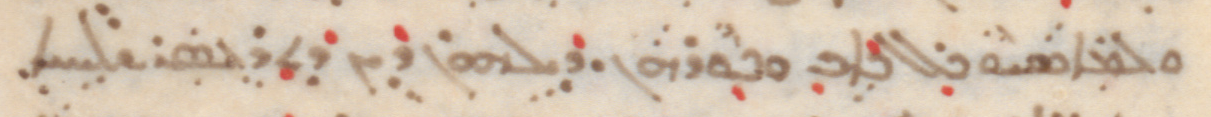ܘܠܡܐܣܝܘ ܟܠ ܟܐܒ ܘܟܘܪܗܢ. ܕܝܠܗܘܢ ܕܝܢ ܕܬܪܥܣܪ ܫܠ̈ܝܚܐ܆
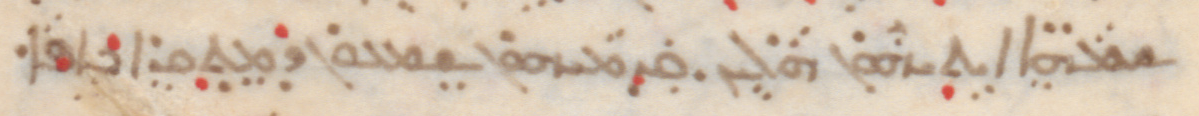ܫܡܗ̈ܐ ܐܝܬܝܗܘܢ ܗ̈ܠܝܢ. ܩܕܡܝܗܘܢ ܫܡܥܘܢ ܕܡܬܩܪܐ ܟܐܦܐ.
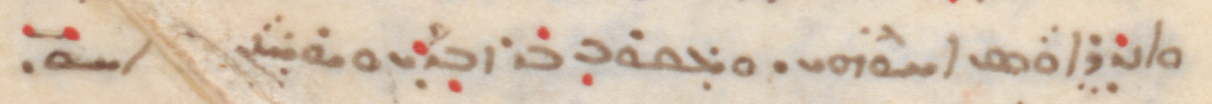ܘܐܢܕܪܐܘܣ ܐܚܘܗܝ. ܘܝܥܩܘܒ ܒܪ ܙܒܕܝ ܘܝܘܚܢܢ ܐ܏ܚܘ.
